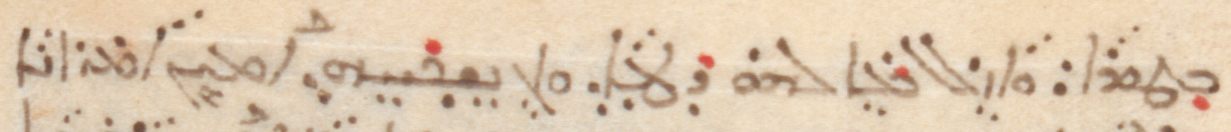ܒܛܘܪܐ: ܘܐ̇ܙܠ ܒ̇ܥܐ ܠܗ̇ܘ ܕܛܥܐ܆ ܘܐܢ ܢܫܟܚܗ܆ ܐܡܝܢ ܐܡ̇ܪ ܐܢܐ
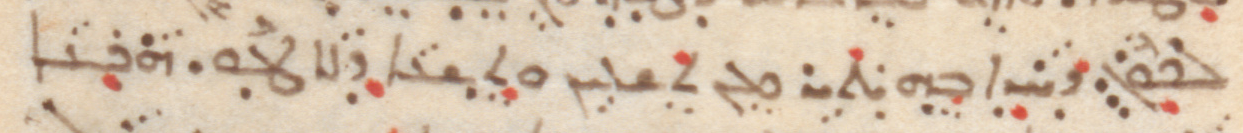ܠܟܘܢ܆ ܕܚ̇ܕܐ ܒܗ ܝܬܝܪ ܡܢ ܬܫܥܝܢ ܘܬܫܥܐ ܕܠܐ ܛܥܘ. ܗܟܢܐ
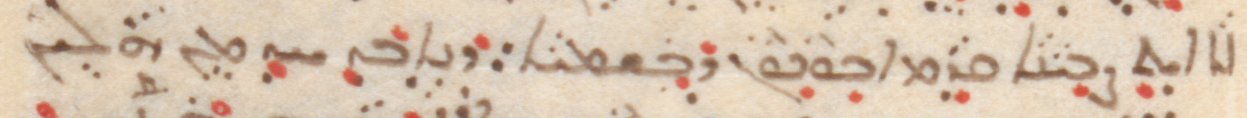ܠܐ ܐܝܬ ܨܒܝܢܐ ܩܕܡ ܐܒܘܟܘܢ ܕܒܫܡܝܐ܇ ܕܢܐܒܕ ܚܕ ܡܢ ܗܠܝܢ
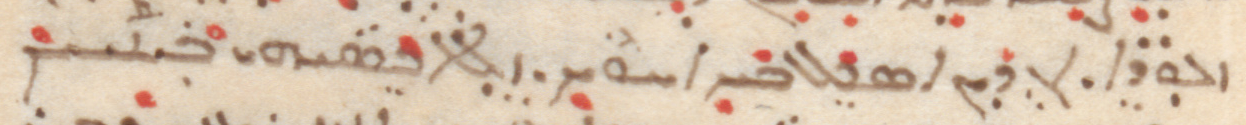ܙܥܘܪ̈ܐ. ܐܢ ܕܝܢ ܐܣܟܠ ܒܟ ܐܚܘܟ. ܙܠ ܐܟܣܝܗܝ ܒܝܢܝܟ
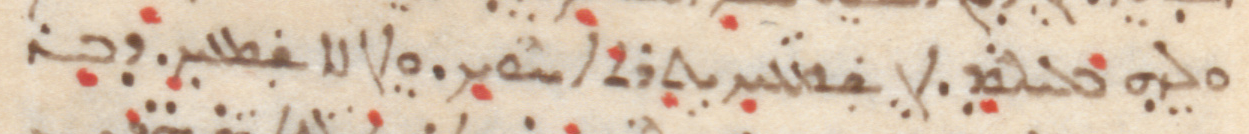ܘܠܗ ܒܠܚܘܕ܆ ܐܢ ܫܡܥܟ ܝܬܪܬ ܐܚܘܟ. ܘܐܢ ܠܐ ܫܡܥܟ ܕܒܪ
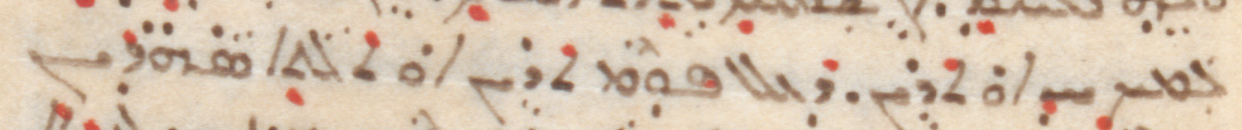ܥܡܟ ܚܕ ܐܘ ܬܪܝܢ. ܕܥܠ ܦܘܡ ܬܪܝܢ ܐܘ ܬܠܬܐ ܣܗ̈ܕܝܢ
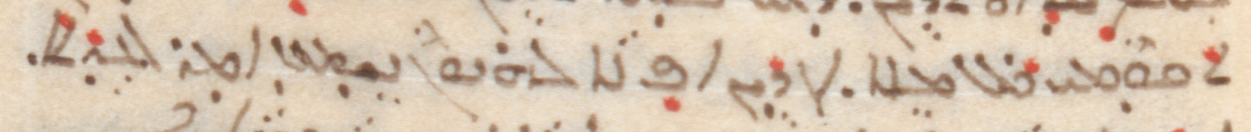ܬܩܘܡܝ ܟܠ ܡܠܐ. ܐܢ ܕܝܢ ܐܦ ܠܐ ܠܗܢܘܢ ܢܫܡ̣ܥ ܐܡ̣ܪ ܠܥܕܬܐ.
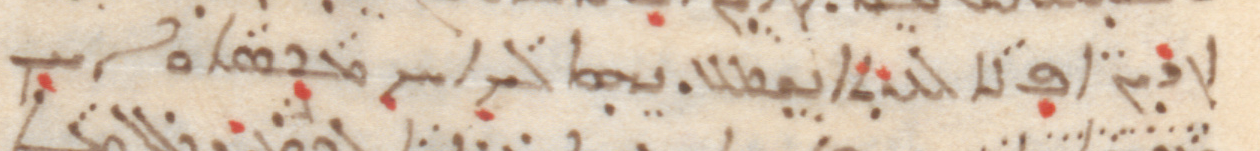ܐܢ ܕܝܢ ܐܦ ܠܐ ܠܥܕܬܐ ܢܫܡܥ. ܢܗܘܐ ܠܟ ܐܝܟ ܡܟܣܐ ܘܐܝܟ
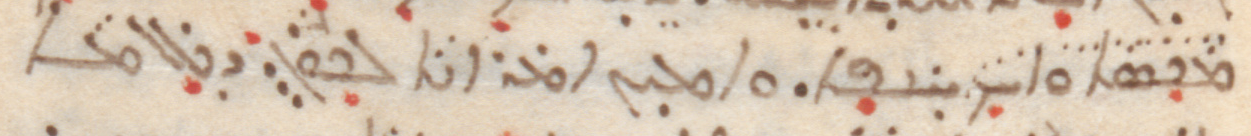ܡ̈ܟܣܐ ܘܐܝܟ ܚܢܦܐ. ܘܐܡܝܢ ܐܡܪ ܐܢܐ ܠܟܘܢ܆ ܕܟܠ ܡܐ
